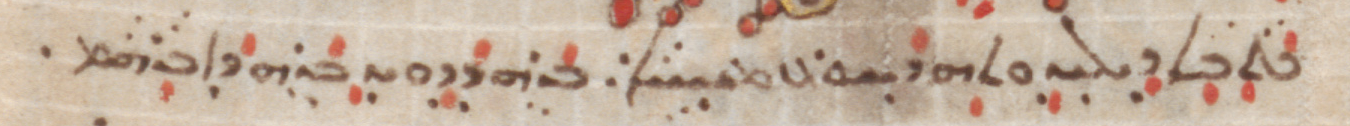ܟܬܒܐ ܕܝܠܝܕܘܬܗ ܕܝܫܘܥ ܡܫܝܚܐ ܒܪܗ ܕܕܘܝܕ ܒܪܗ ܕܐܒܪܗܡ.
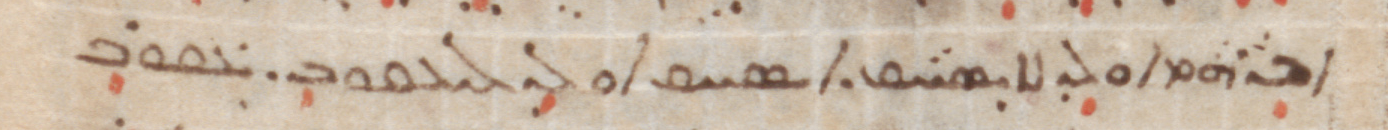ܐܒܪܗܡ ܐܘܠܕ ܠܐܝܣܚܩ. ܐܝܣܚܩ ܐܘܠܕ ܠܝܥܩܘܒ. ܝܥܩܘܒ
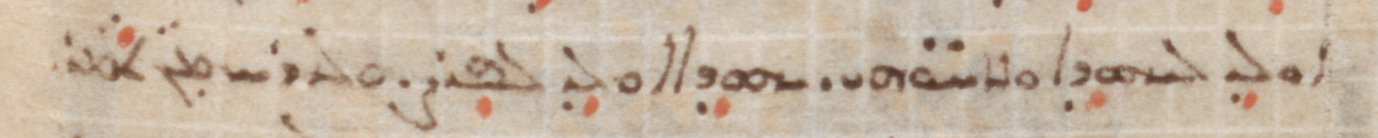ܐܘܠܕ ܠܝܗܘܕܐ ܘܠܐܚ̈ܘܗܝ. ܝܗܘܕܐ ܐܘܠܕ ܠܦܪܨ. ܘܠܙܪܚ ܡ̣ܢ ܬܡܪ
